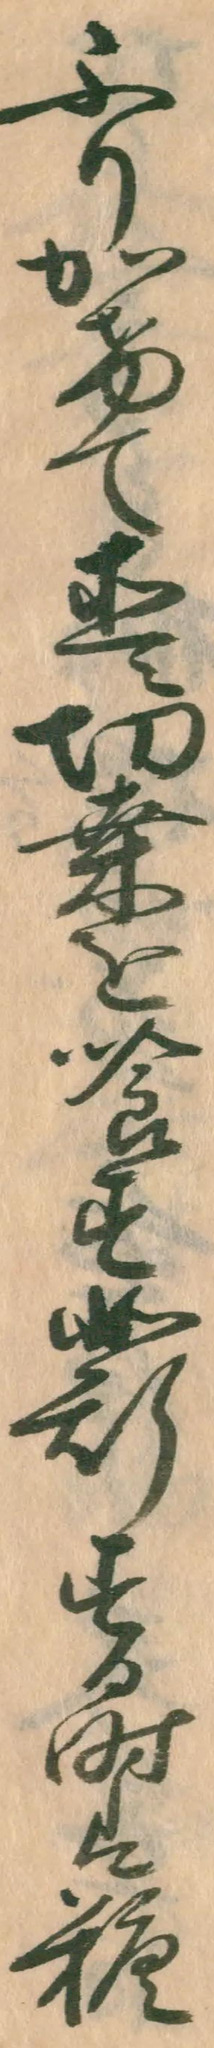ふりかけて直に切桑を喰す如斯する時は糖
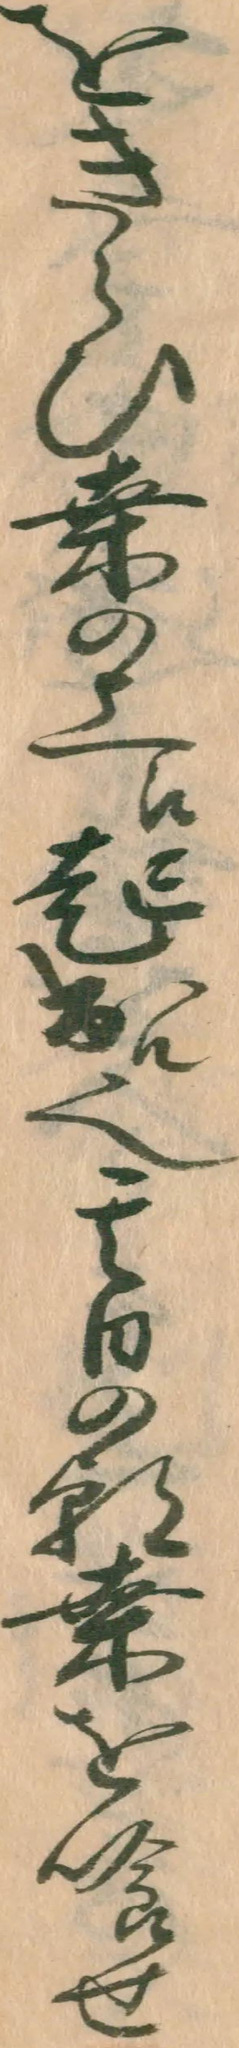をきらひ桑の上え起出る也其日の朝桑を喰せ
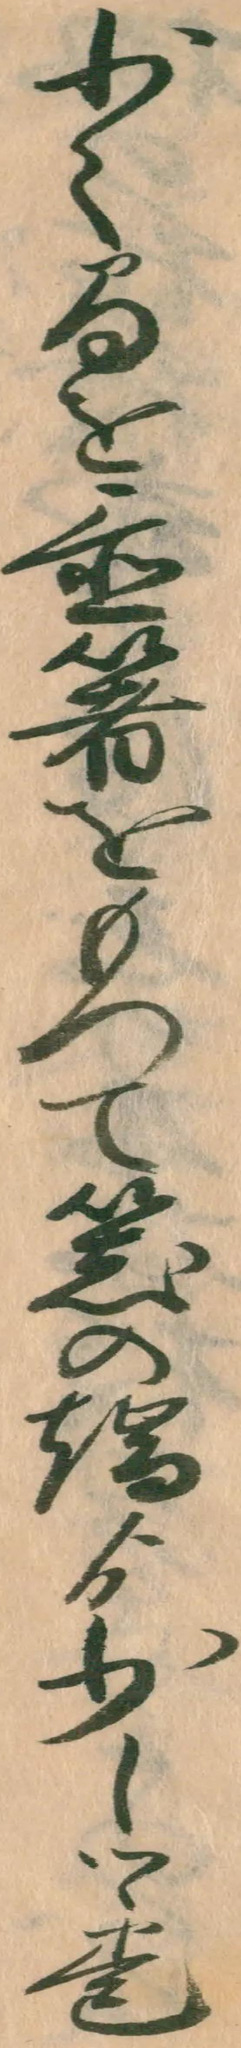少々間を置箸をもつて器の端ゟ少しつゝ巻
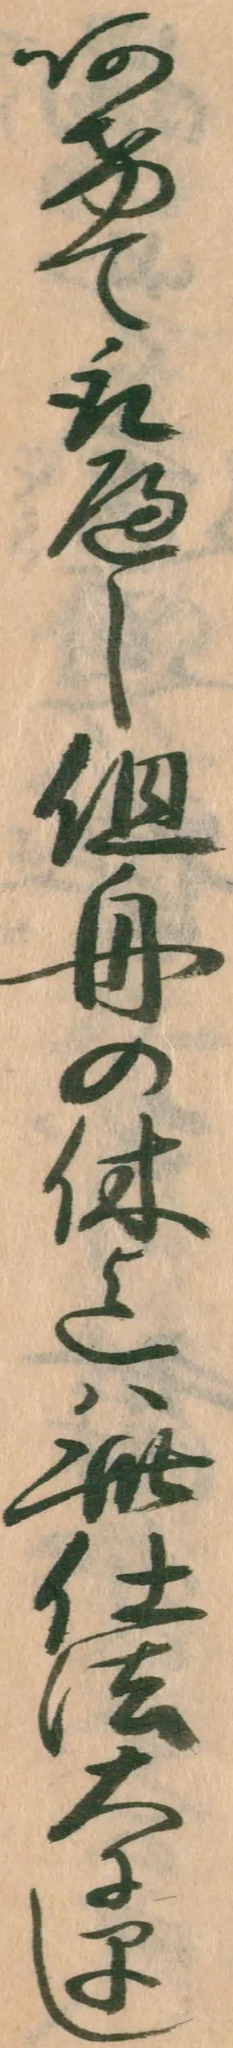あけて取へし但舟の休迄は此仕法大に早し
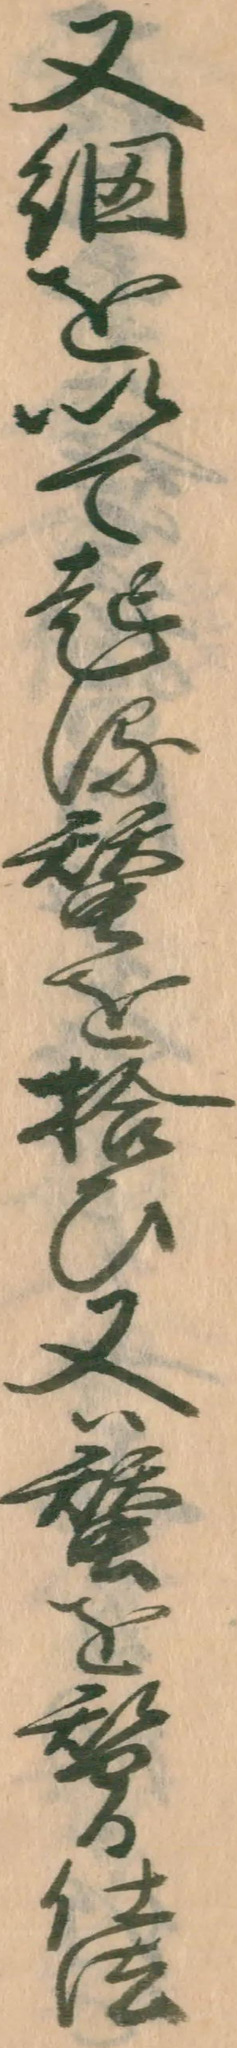又網を以て起る蚕を拾ひ又は蚕を替る仕法
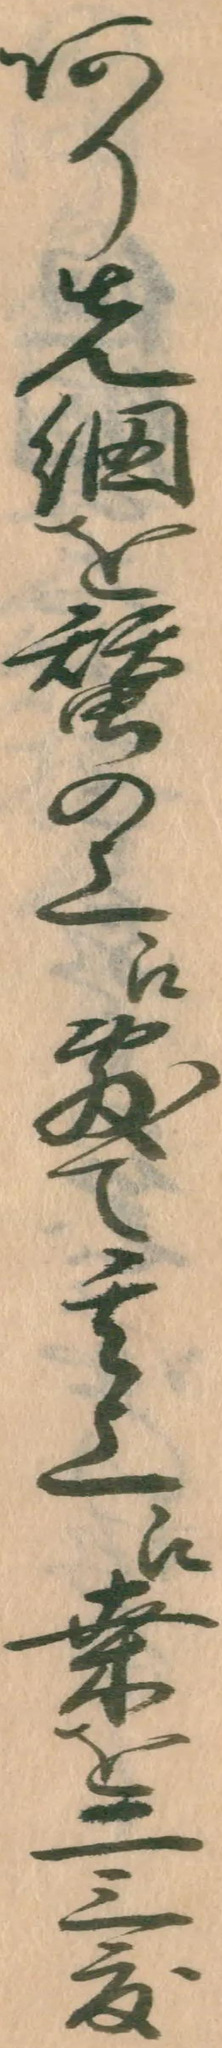あり先網を蚕の上え敷て其上え桑を二三度
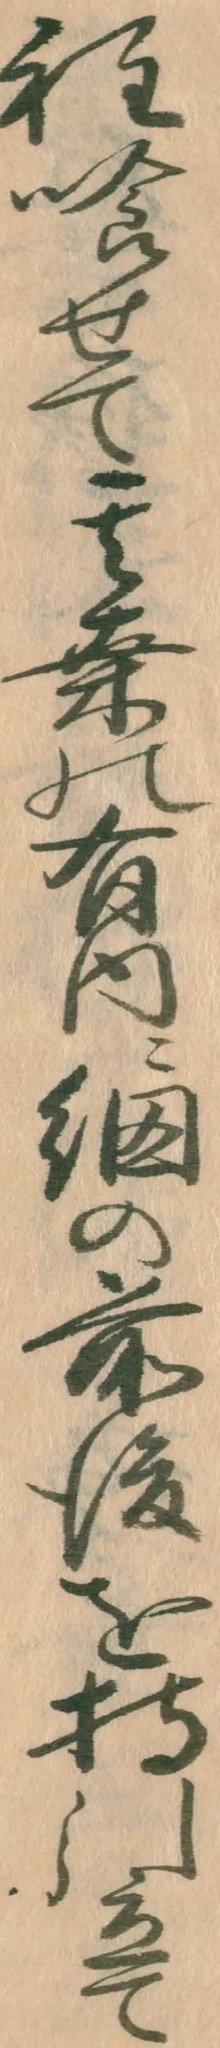程喰せて其桑の有内ニ網の前後を持引立て
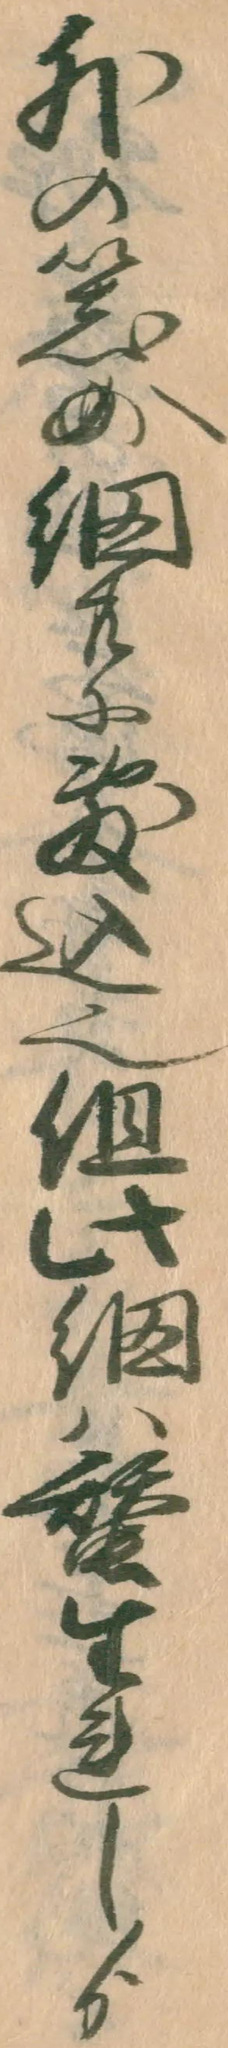外の器へ網共に敷込也但此網は蚕生れしゟ
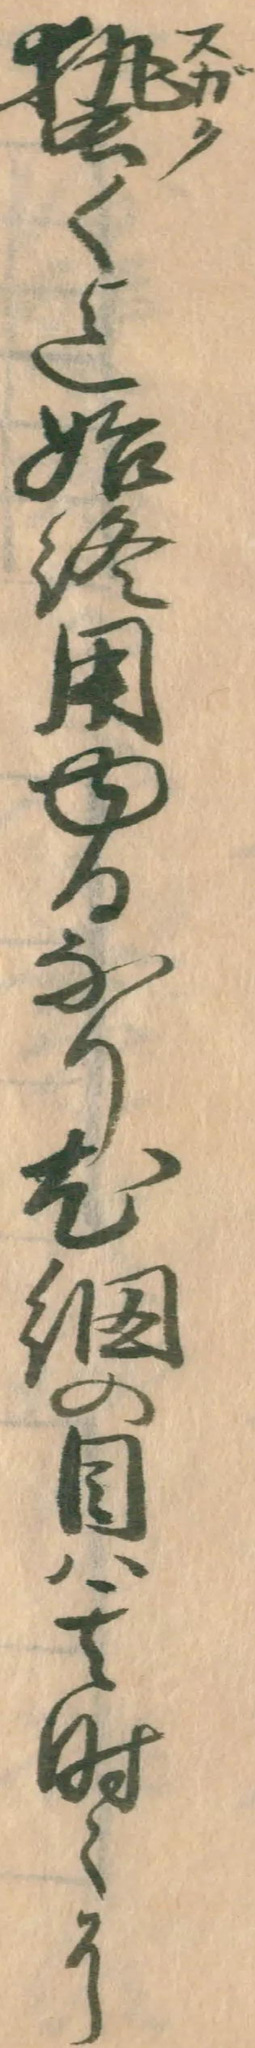蟄く迄始終用ゆるなり尤網の目は其時々に
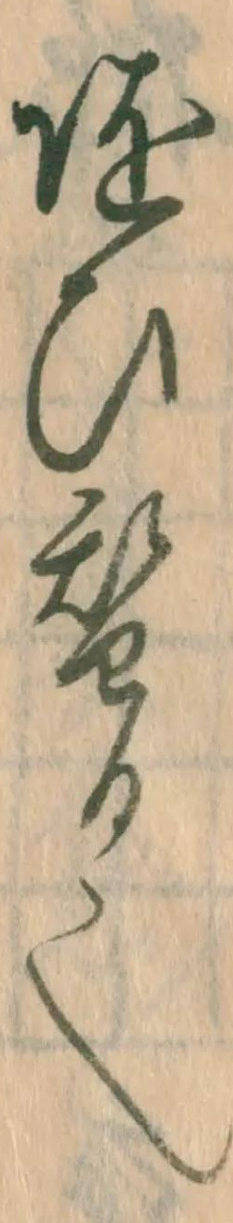随ひ替る也
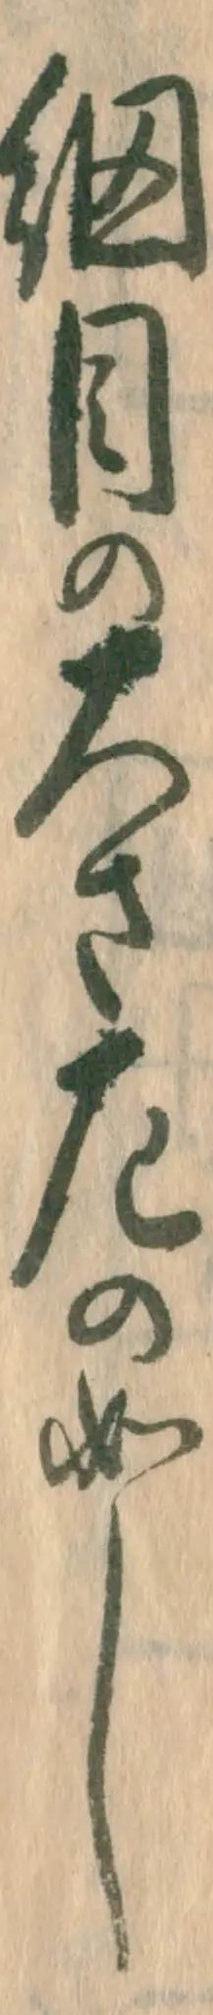網目大さ左の如し

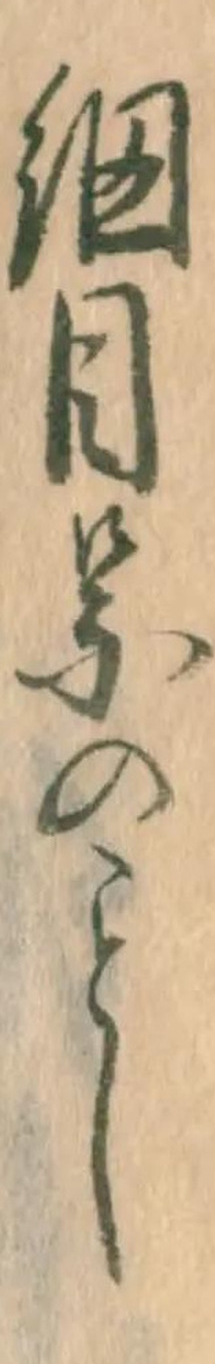網目図のことし
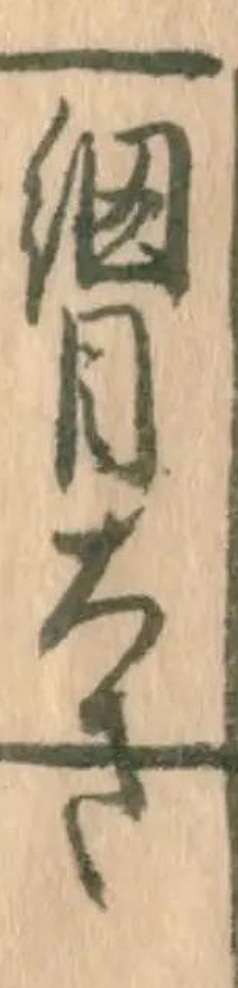網目大さ
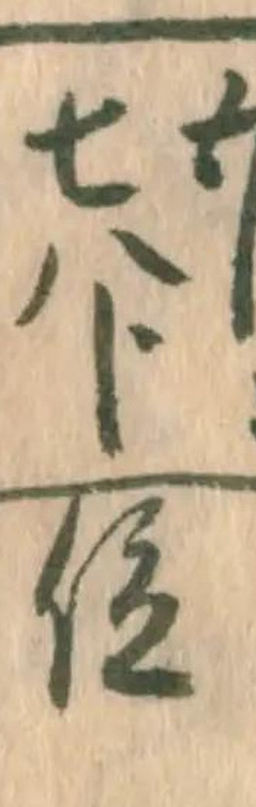七八分位
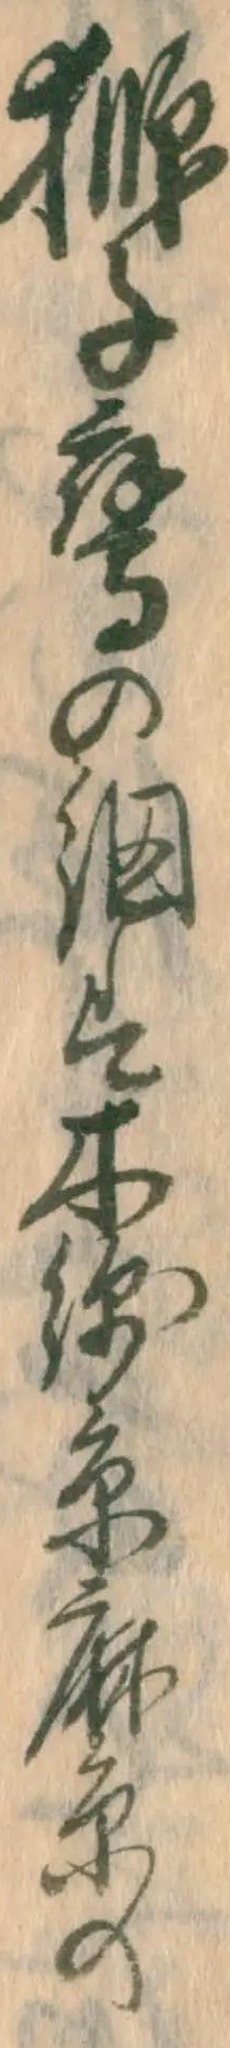獅子鷹の網は木綿糸麻糸の
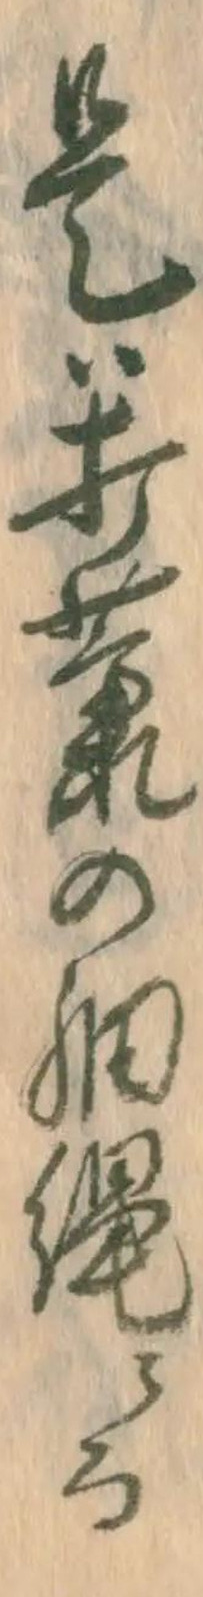是は打藁の細縄にて
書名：養蚕録
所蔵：国立国会図書館 National Diet Library, JAPAN
